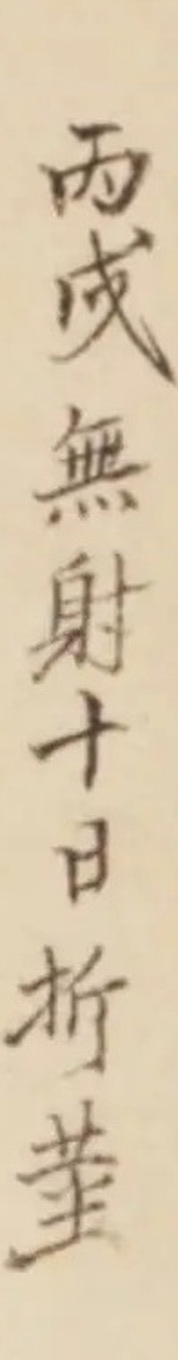丙戌無射十日折莖
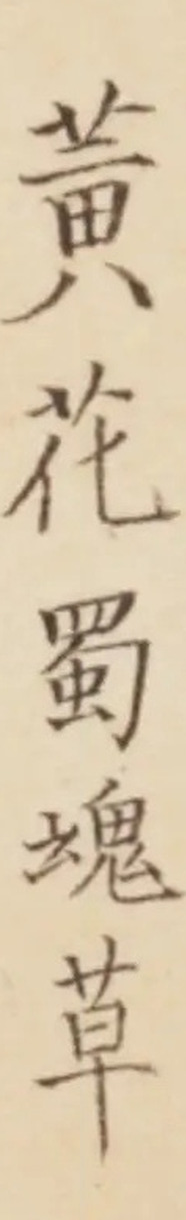黄花蜀魂草
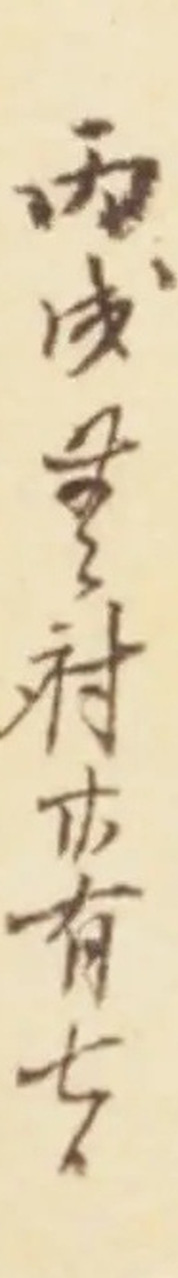丙戌無射廿有七日
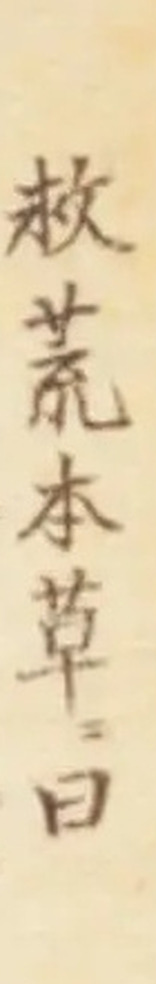救荒本草に曰

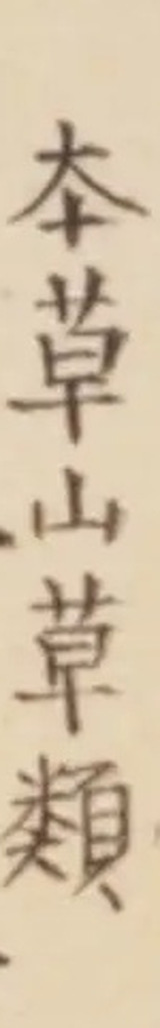本草山草類
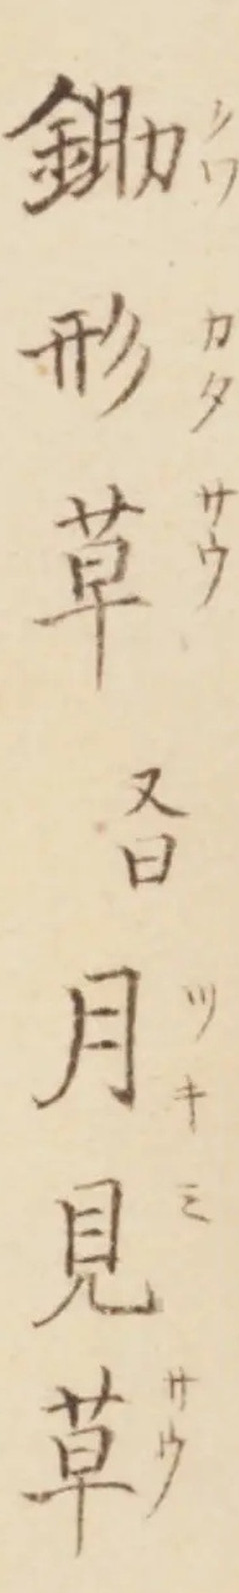鋤形草又曰月見草
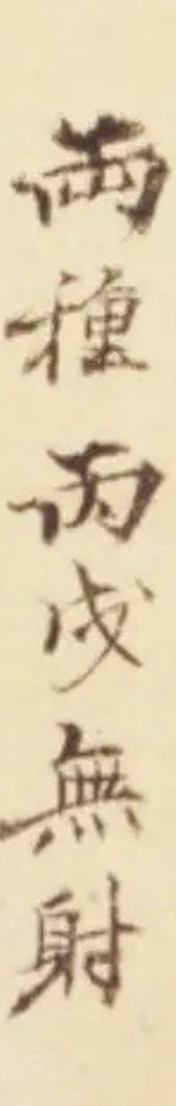両種丙戌無射
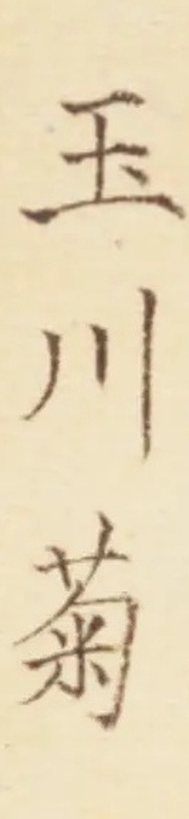玉川菊
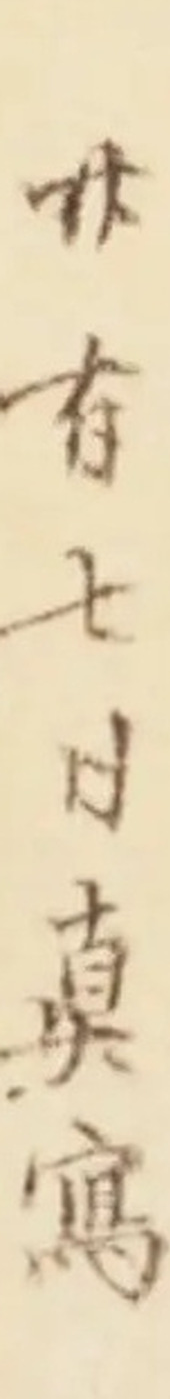廿有七日真寫

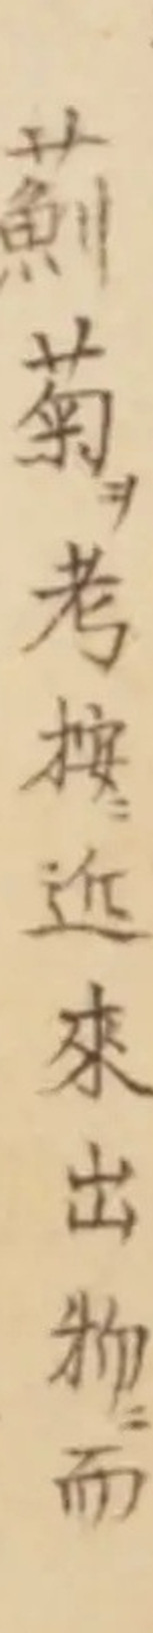薊菊ヲ考按ニ近來出物ニ而
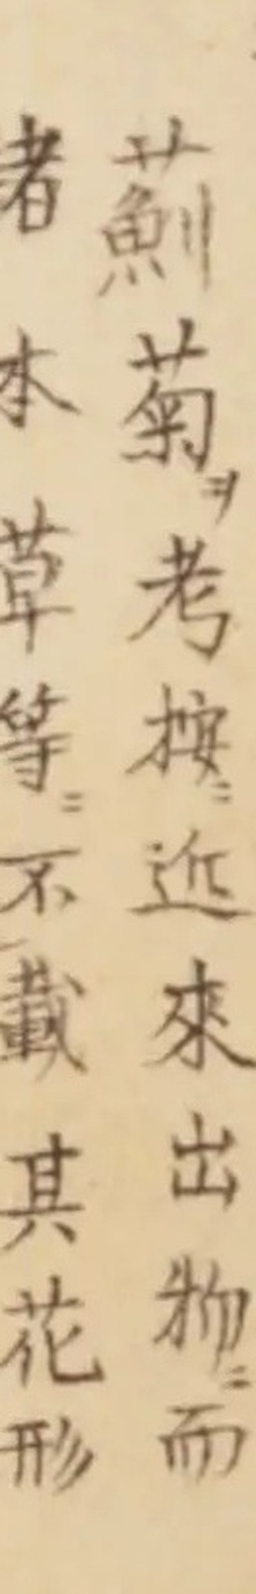諸本草等ニ不載其花形
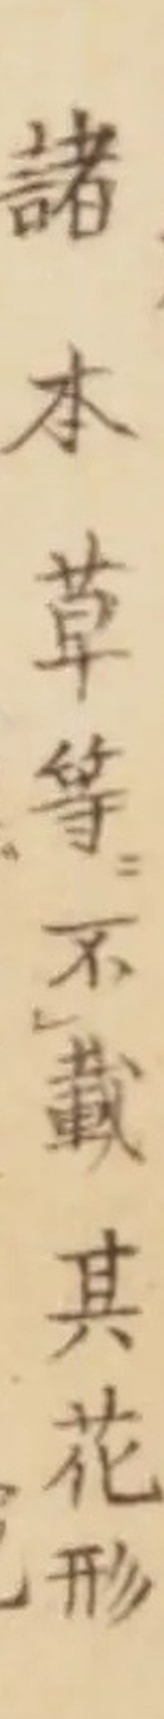諸本草等ニ不載其花形
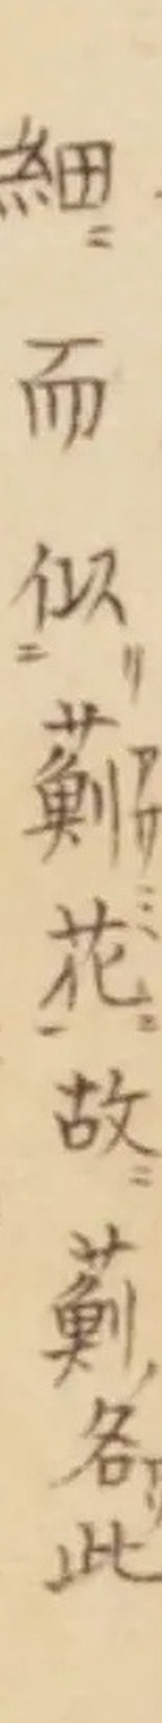細ニ而似リ薊花ニ故ニ薊ノ名アリ此
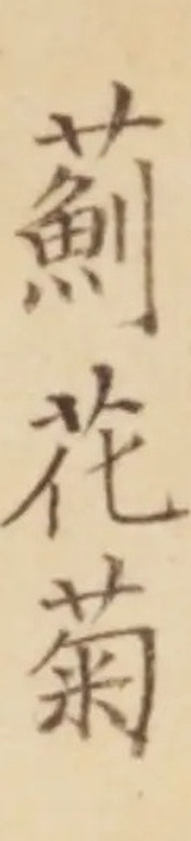薊花菊
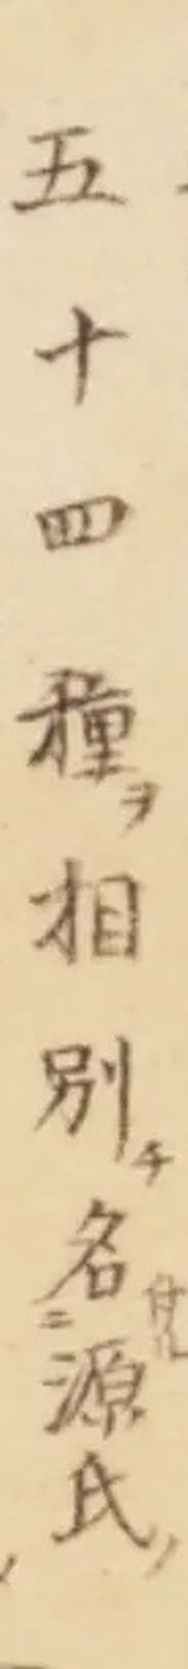五十四種ヲ相別チ名付ル源氏ノ
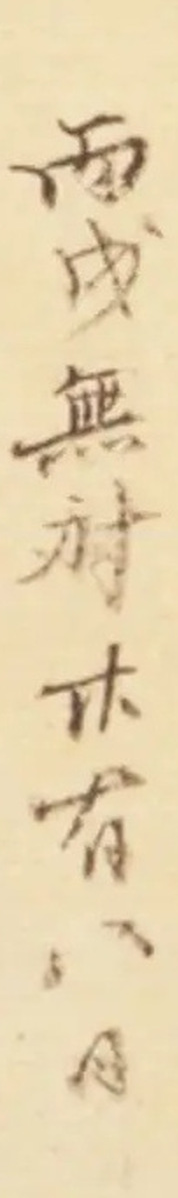丙戌無射廿有八日
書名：梅園草木花譜秋之部. 3
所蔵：国立国会図書館 National Diet Library, JAPAN
